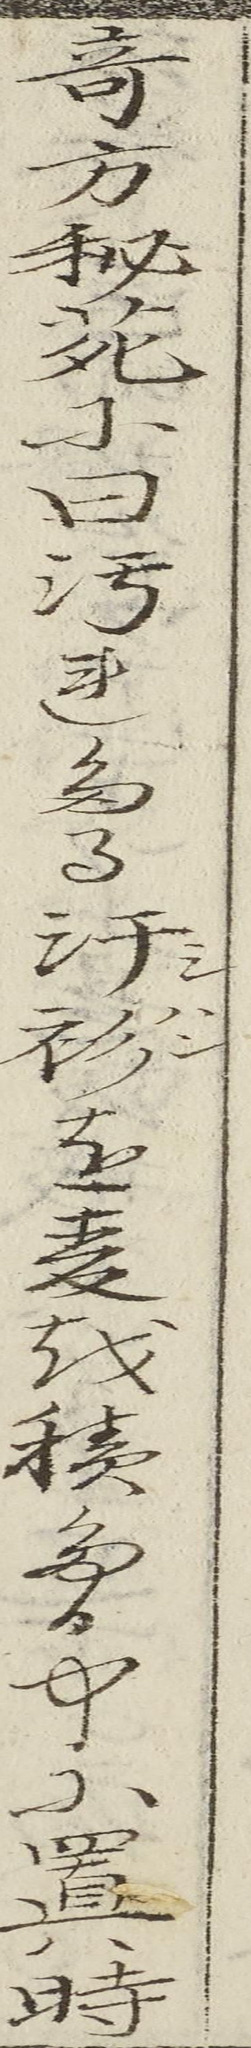奇方秘苑に曰汚れたる汗衫を麦を積たる中に置時
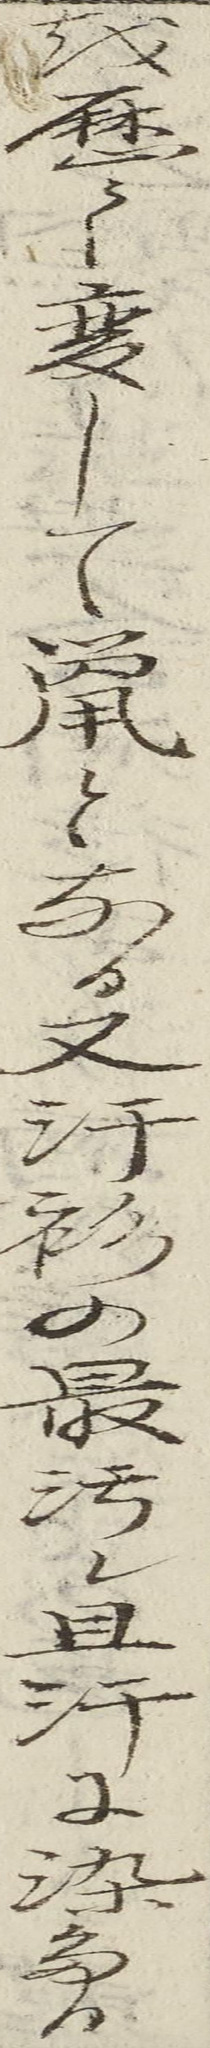を歴て変して鼠となる又汗衫の最汚レ且汗に染たる
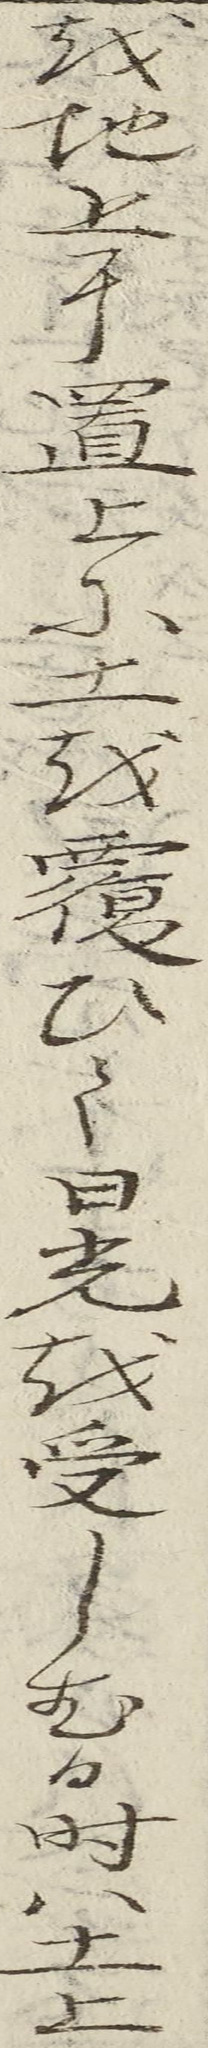を地上に置上に土を覆ひて日光を受しむる時ハ土上
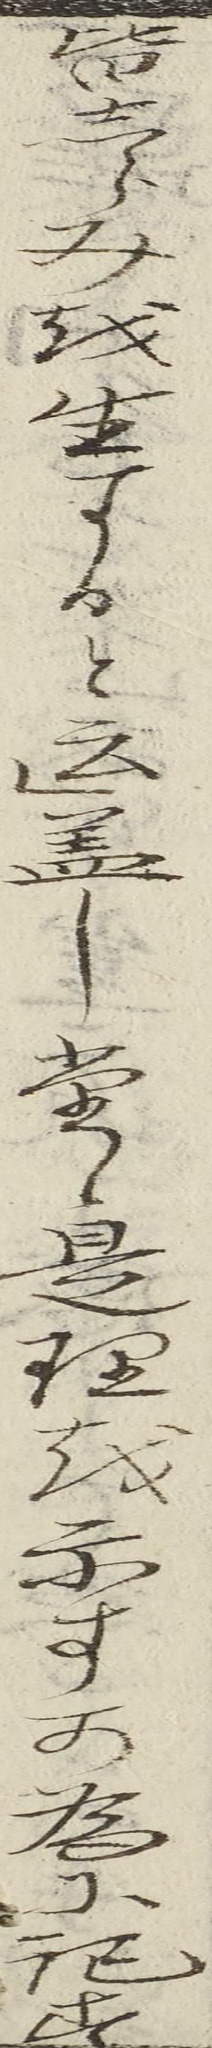皆しらみを生すると云」蓋し常々是理を示すか為に記す
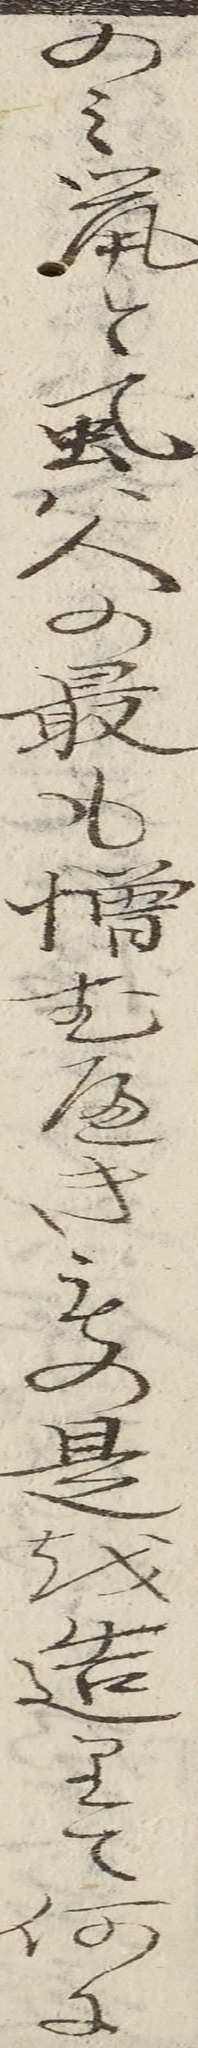のミ鼠と虱ハ人の最も憎むへきもの是を造りて何に
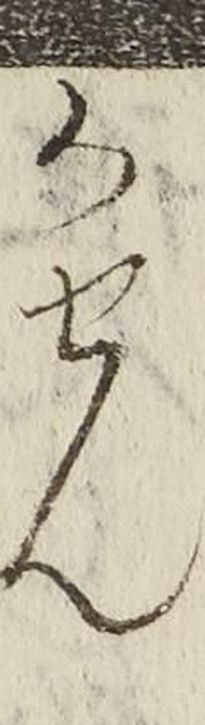かせん
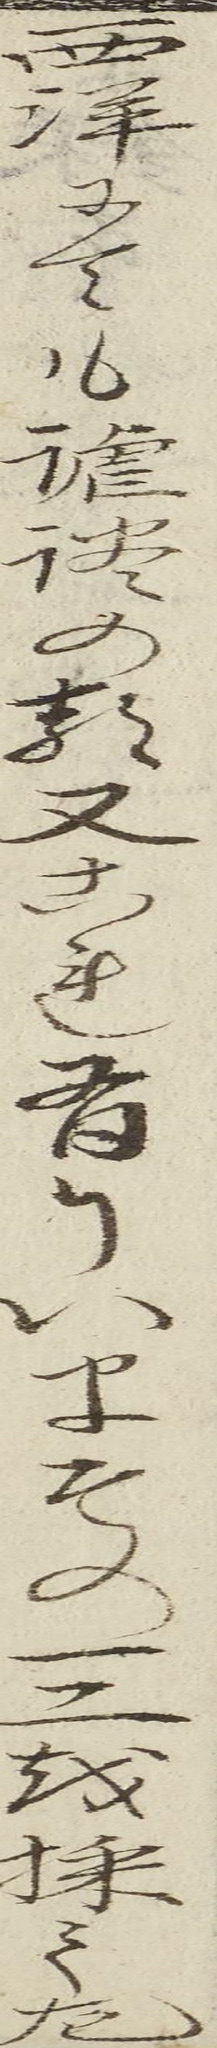西洋にても謔談の類又これ有いまその一二を採て左

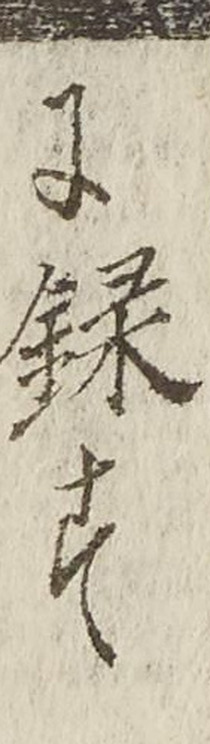に録す
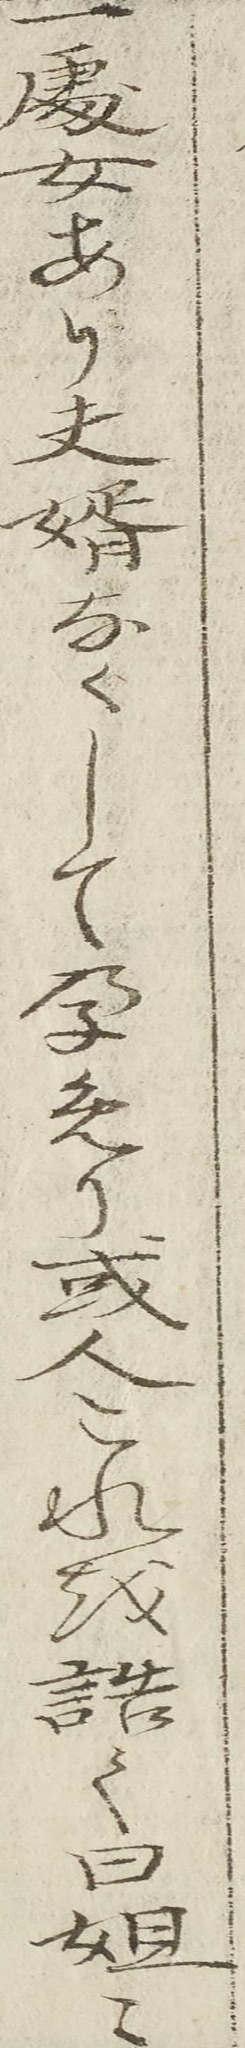一処女あり夫婿なくして孕めり或人これを詰て曰姐二
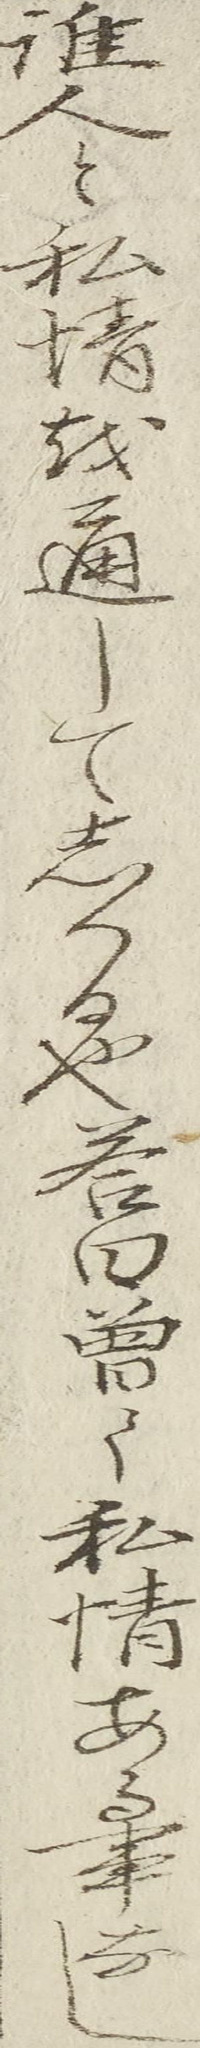誰人と私情を通してしかるや答曰曾て私情ある事なし
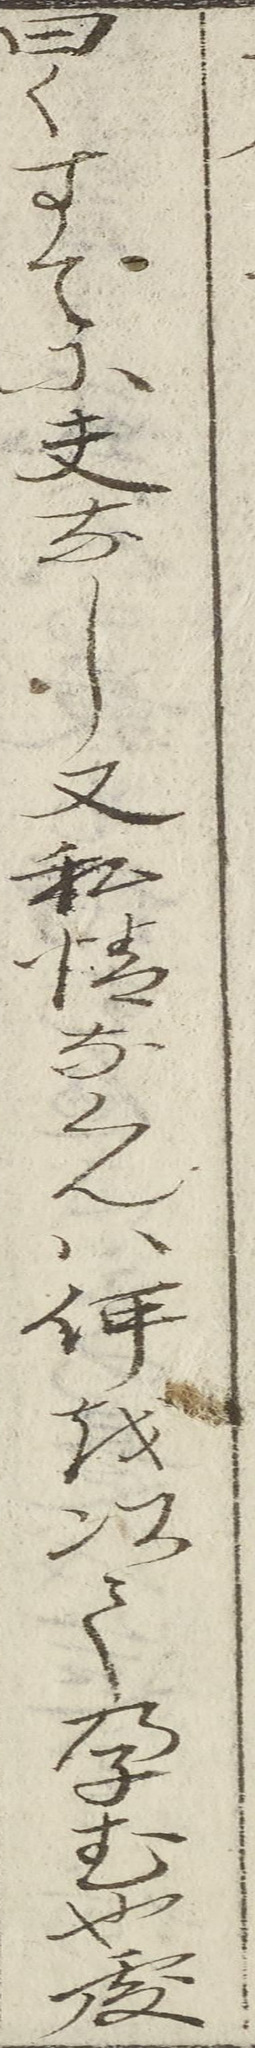曰くすでに夫なし又私情ならんハ何を以て孕むや処
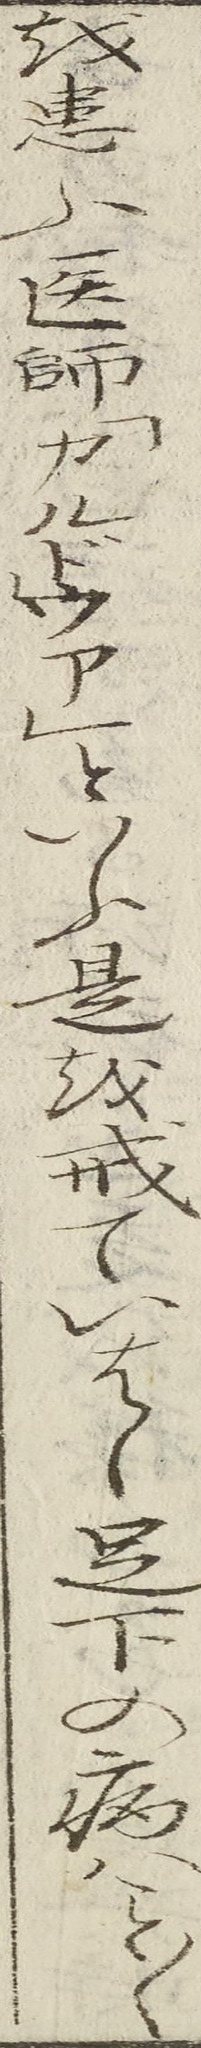を患ふ医師「カルドウア」といふ是を戒ていはく足下の病ハこと〳〵
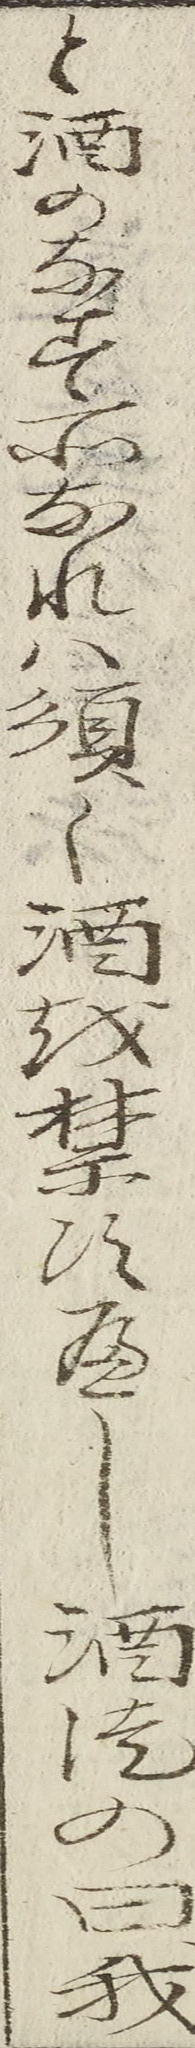く酒のなす所なれハすく酒を禁すへし酒徒の曰我
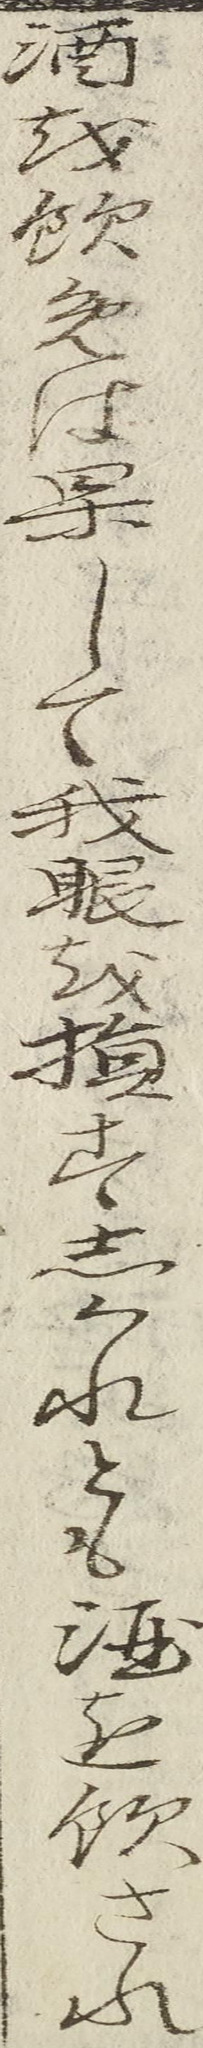酒を飲めは果して我眼を損すしかれとも酒を飲され
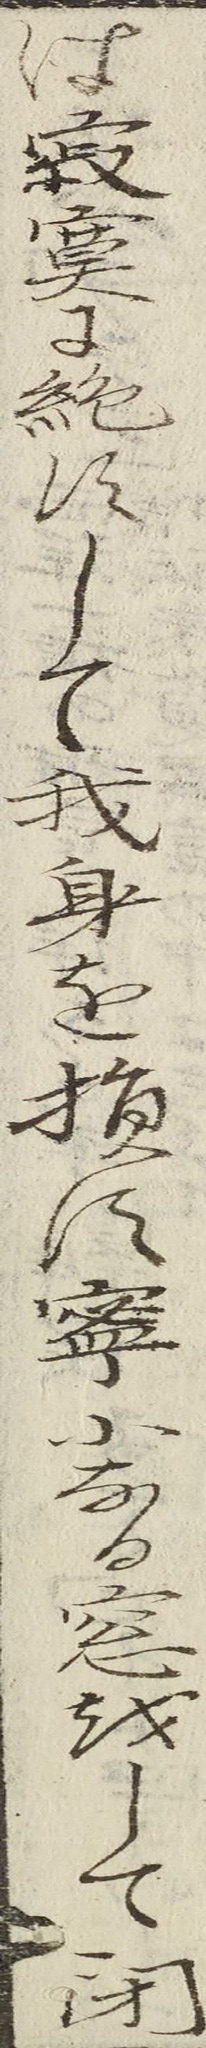は寝寞に絶すして我身を損す寧になる窓をして閉
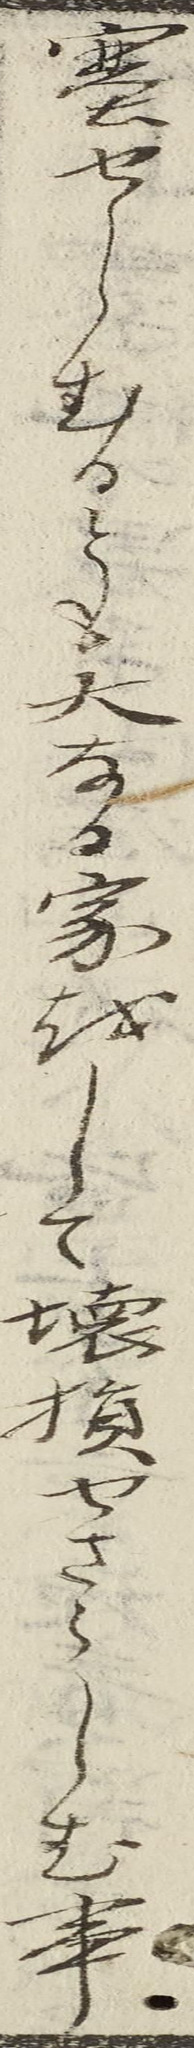塞せしむかとも大なる家をして壊損せさらしむ事
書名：西洋雜記　坤
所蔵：東京大学地震研究所図書室 Earthquake Research Institute Library, The University of Tokyo, JAPAN
